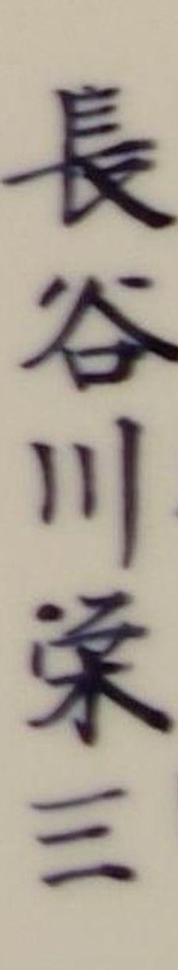長谷川栄三
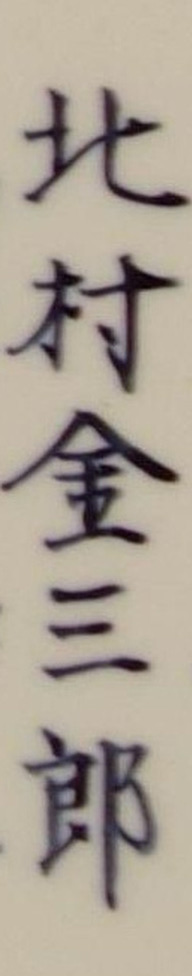北村金三郎
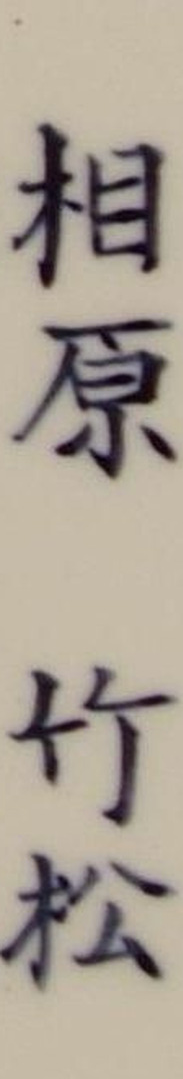相原竹松
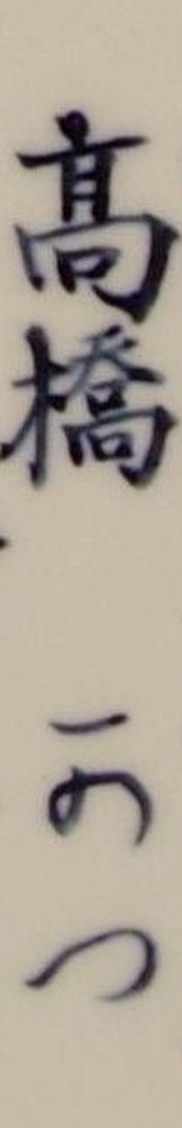高橋かつ
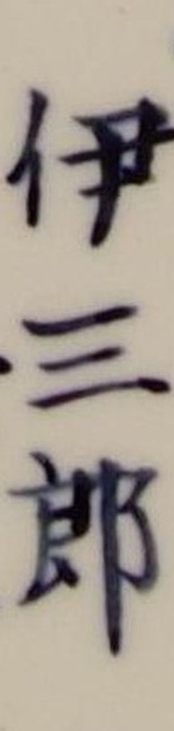伊三郎
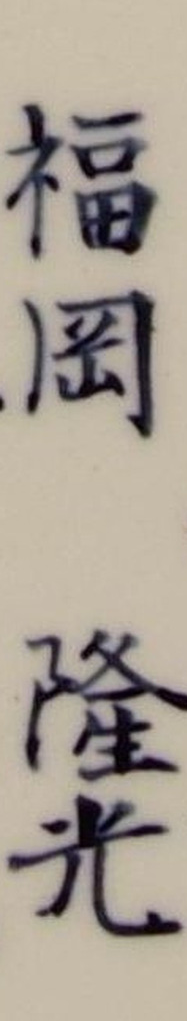福岡隆光
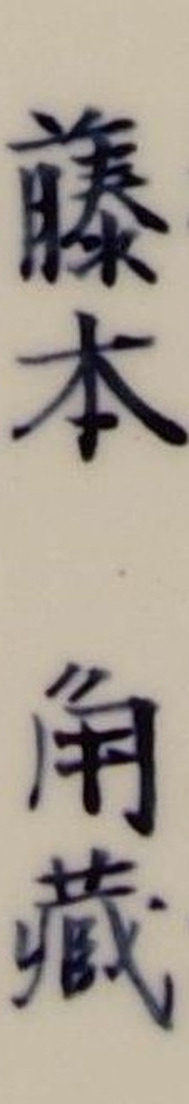藤本角蔵
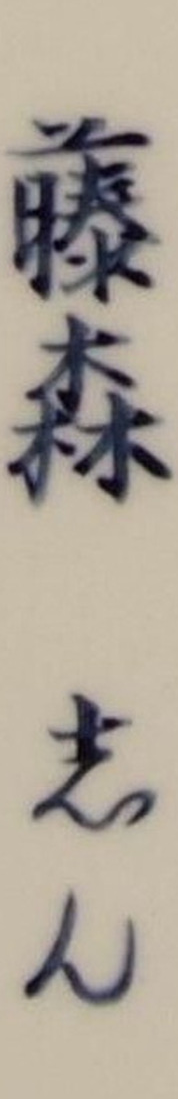藤森しん
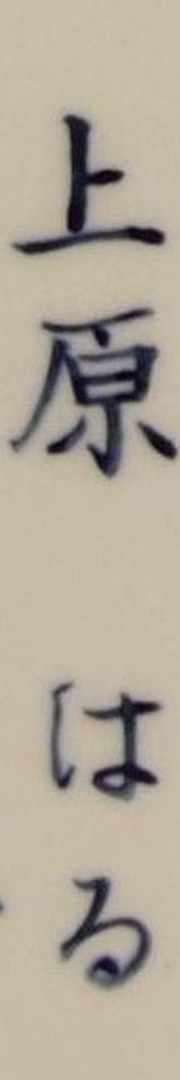上原はる
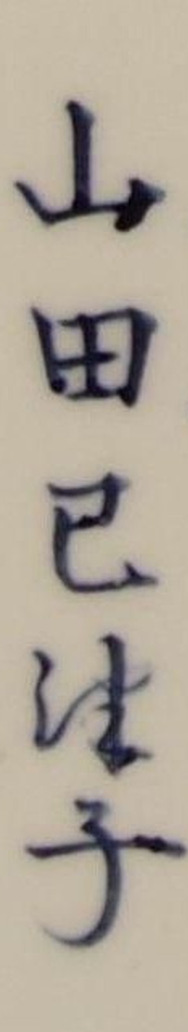山田みつ子
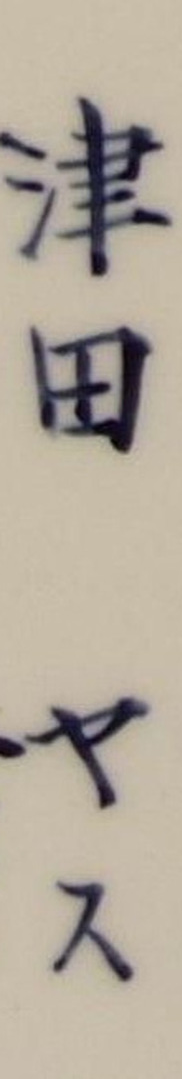津田ヤス
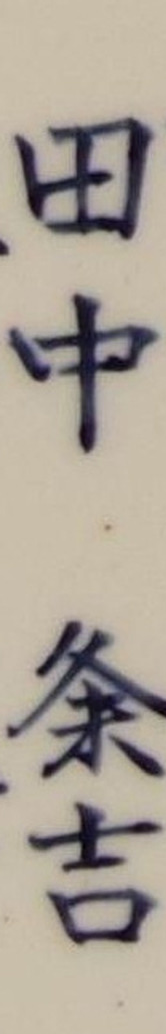田中条吉
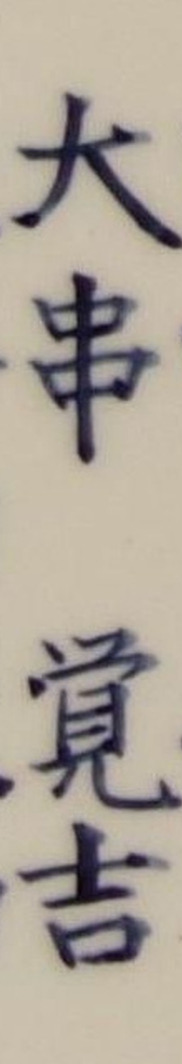大串覚吉
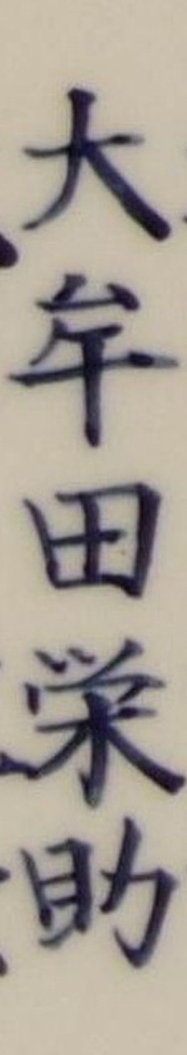大岸田栄助
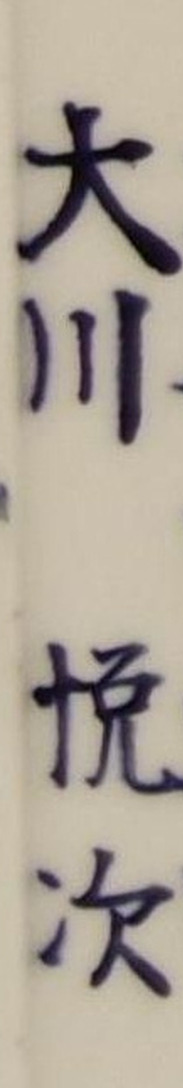大川悦次

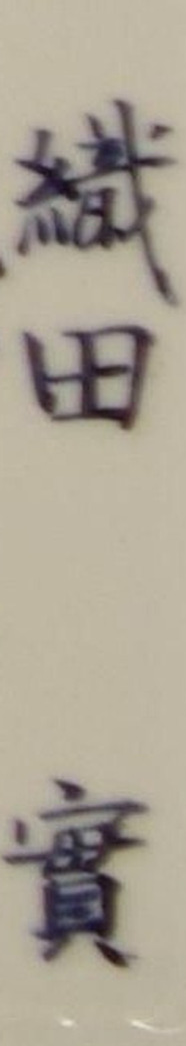織田実
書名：E~L
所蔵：高野山金剛峯寺
